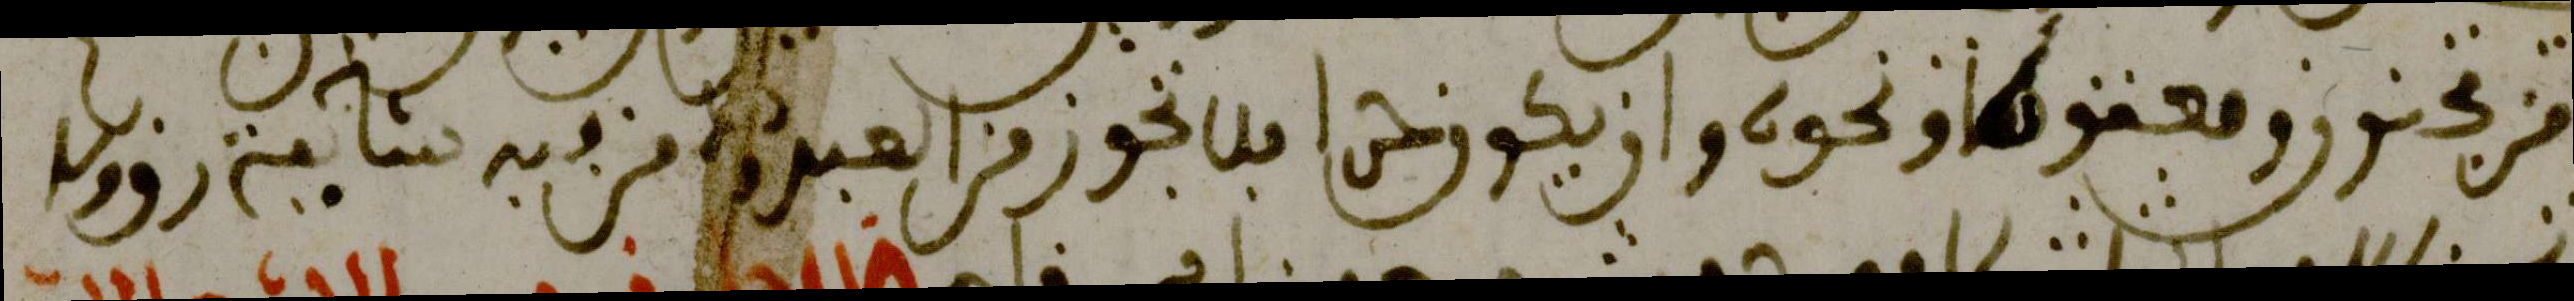من مجنون ومعتوه او نحوه وان يكون حرا ل فلا تجوز من العبد ولا من فيه شائبة رق ولا
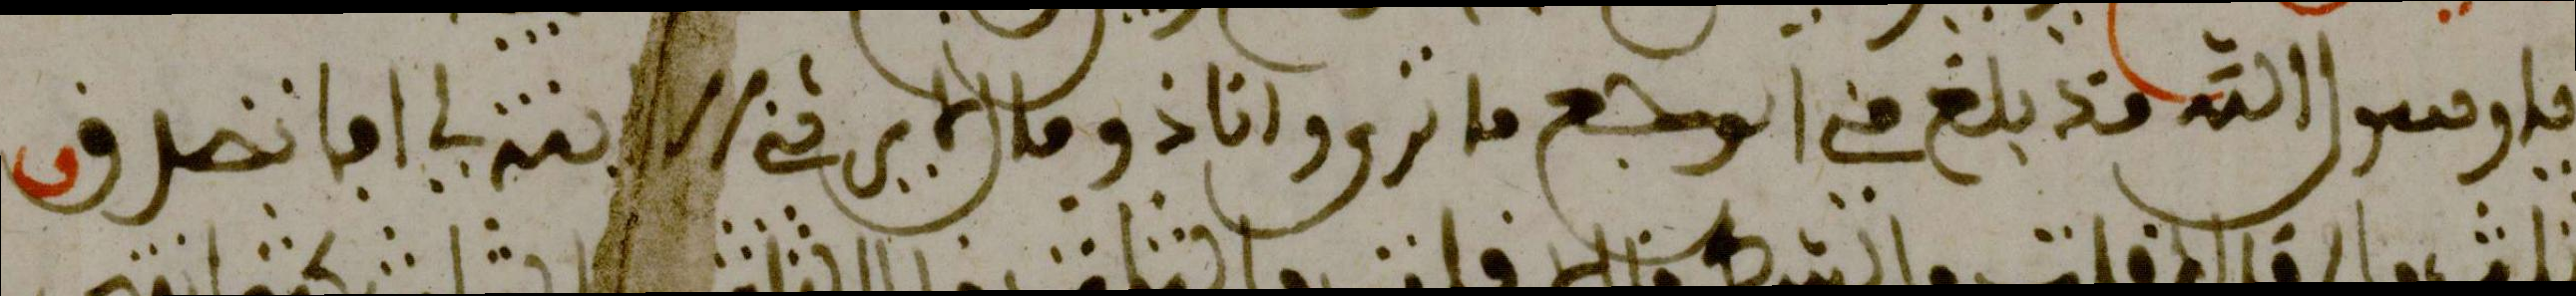يا رسول الله قد بلغ مني الوجع ما ترى وانا ذو مال لا يرثنى الا ينة لي افاتصدق
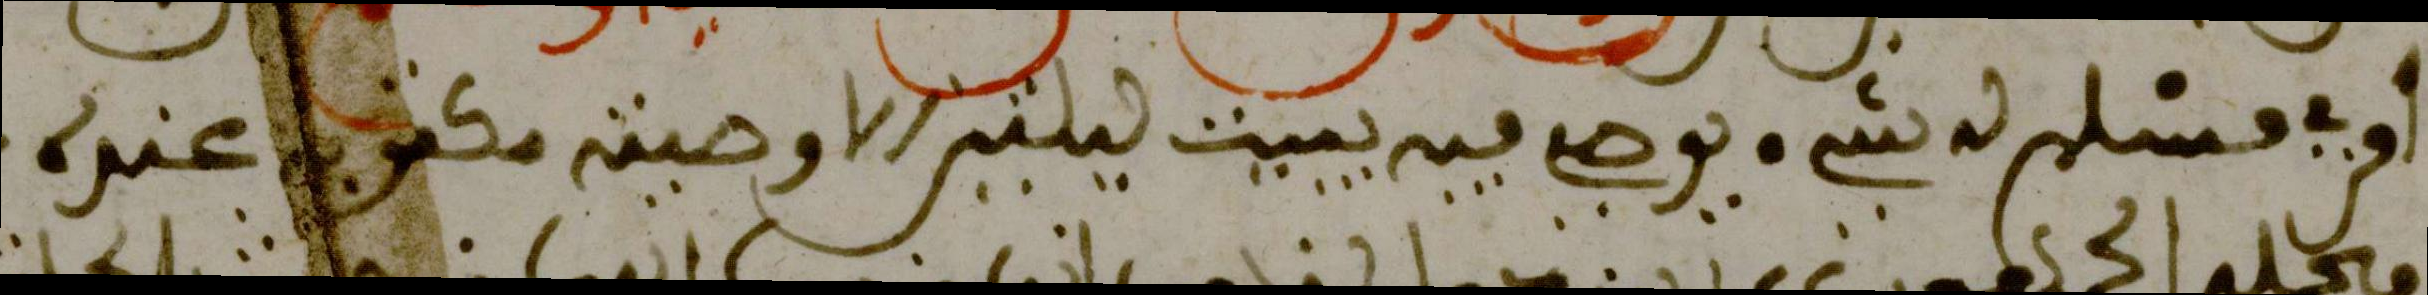امري مسْلم له شيء يوصي فيه يبيت ليلتين الاوصيته مكتوب عنده
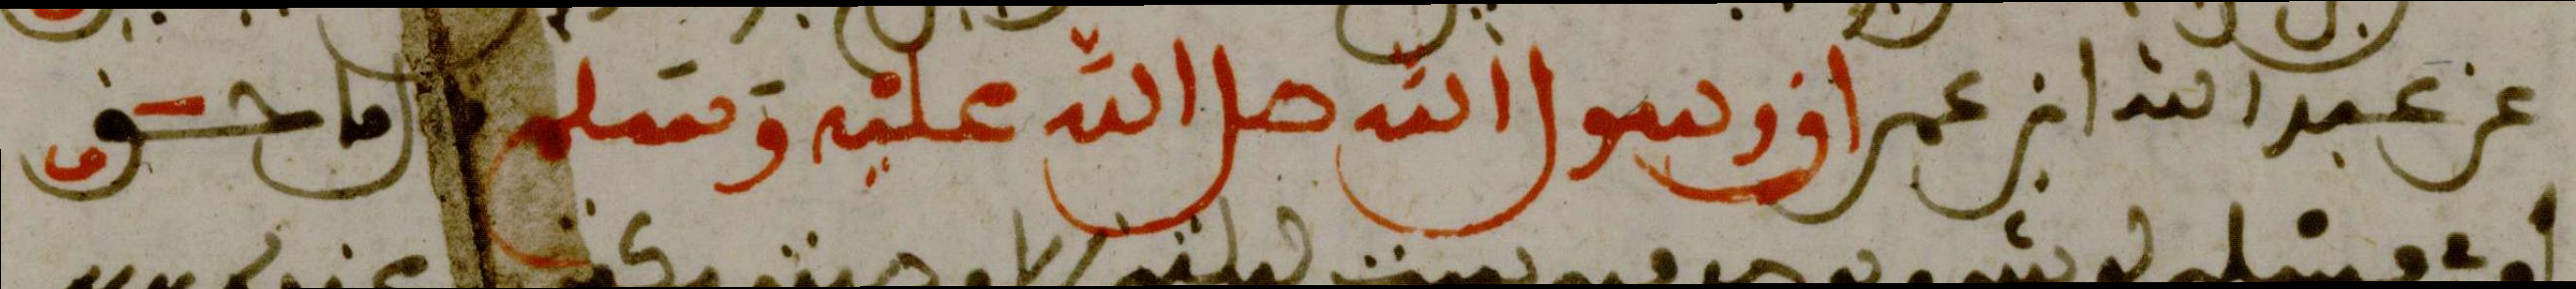عن عبد الله ابن عمر ان رسول الله صل الله عليه وَسَلم قال ما حَق
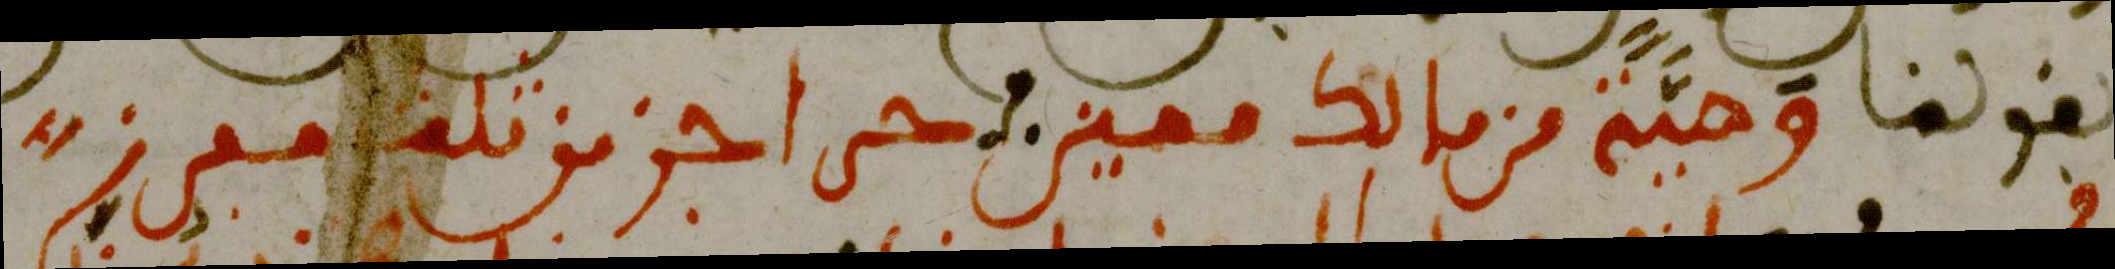بقولنا وَصيّة من مالك مميز حر اجز من ثلث مبرز
